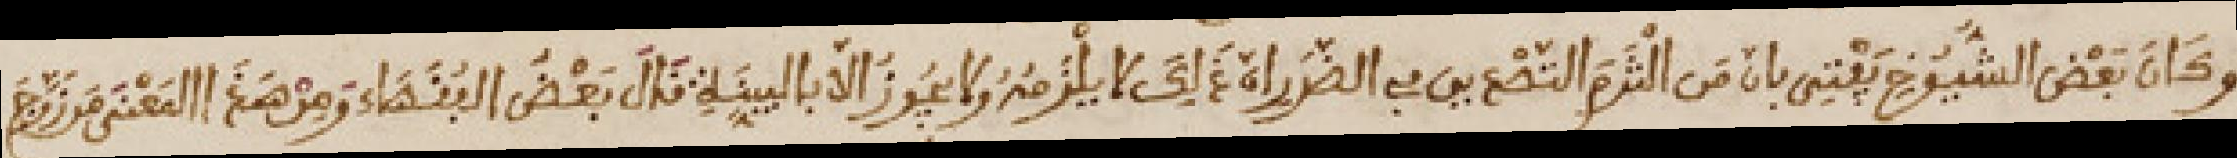وكان بعض الشيوخ يفتي بان من التزم التصديق في الضرر ان ذلك لا يلزمه ولا يجوز الا بالبينة قال بعض الفقهاء ومن هذا المعنى من زوج
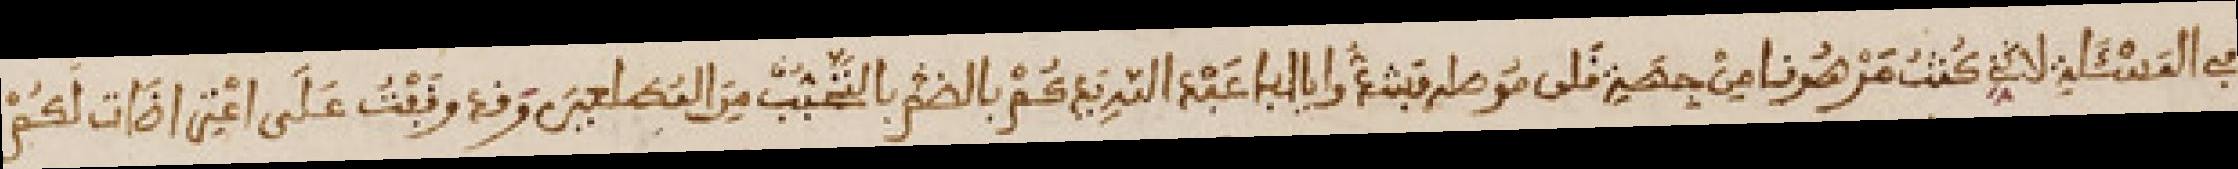في المسئلة لاكني كنت مرهونا من جهة قلى موصله فشدوا يا ابا عبد الله يدكم بالضم بالتحبب من المطلعين وقد وقفت على اعتراضات لكم
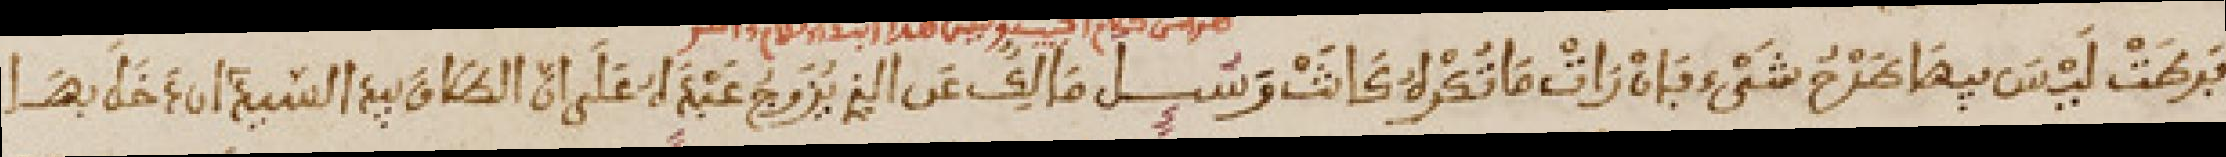فرطت ليس فيها طرح شيء فان رات ما تكره كانت وسئل مالك عن الذي يزوج عبده على ان الطلاق بيد السيد ان دخل بها
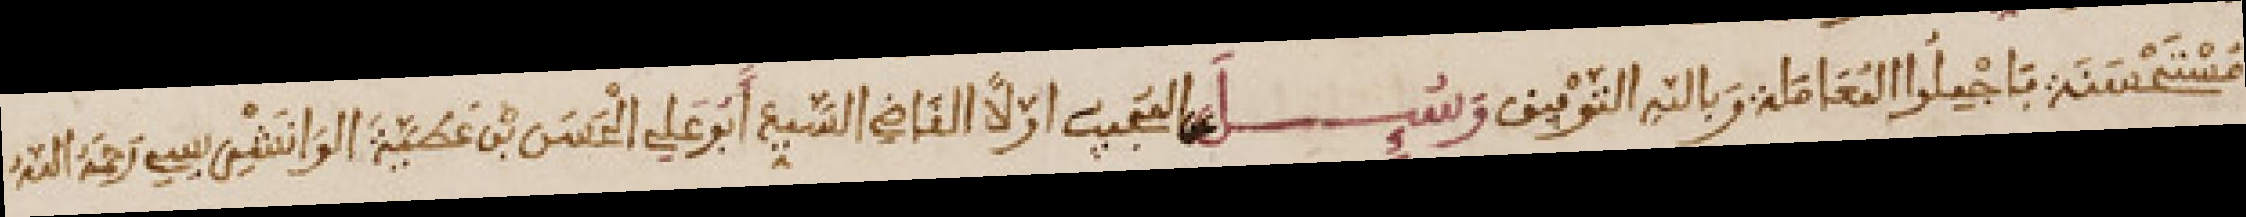مستحسنة فاجملوا المعاملة وبالله التوفيق وسئل المجيب اولا القاضي السيد أبو علي الحسن بن عطية الوانشريسي رحمه الله
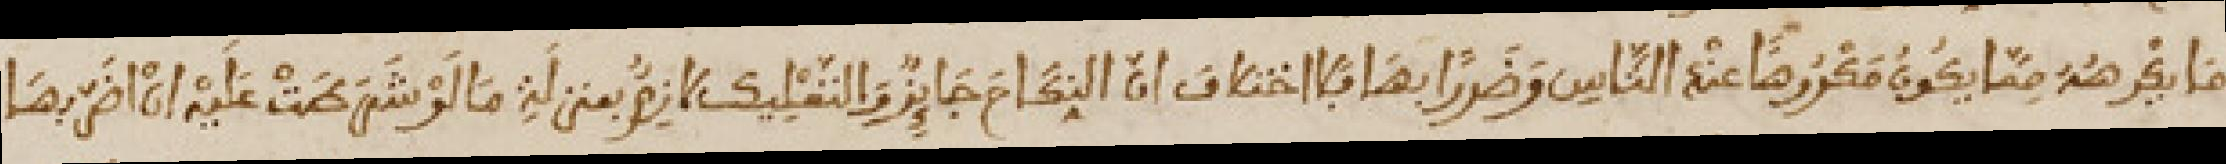ما يكرهه مما يكون مكروها عند الناس وضررا بها فلا اختلاف ان النكاح جائز والتمليك لازم بمنزلة ما لو شرطت عليه ان اضر بها
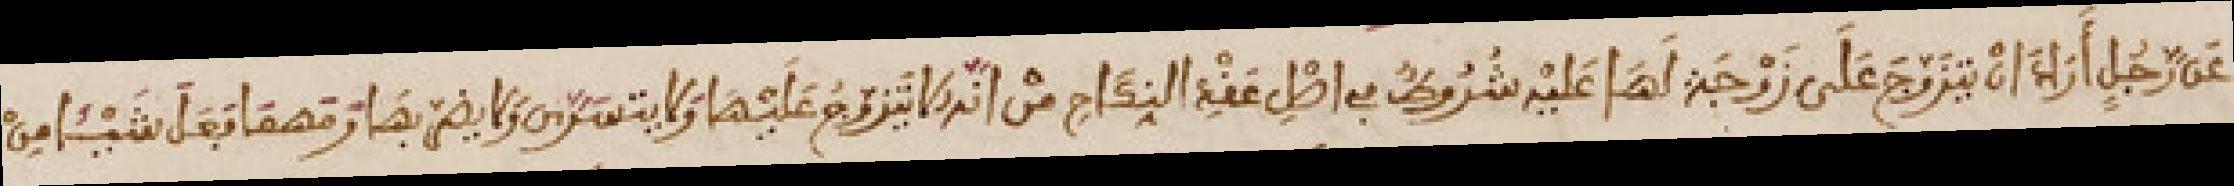عن رجل أراد ان يتزوج على زوجة لها عليه شروط في اصل عقد النكاح من انه لا يتزوج عليها و لا يتسرى ولا يضربها ومهما فعل شيئا من
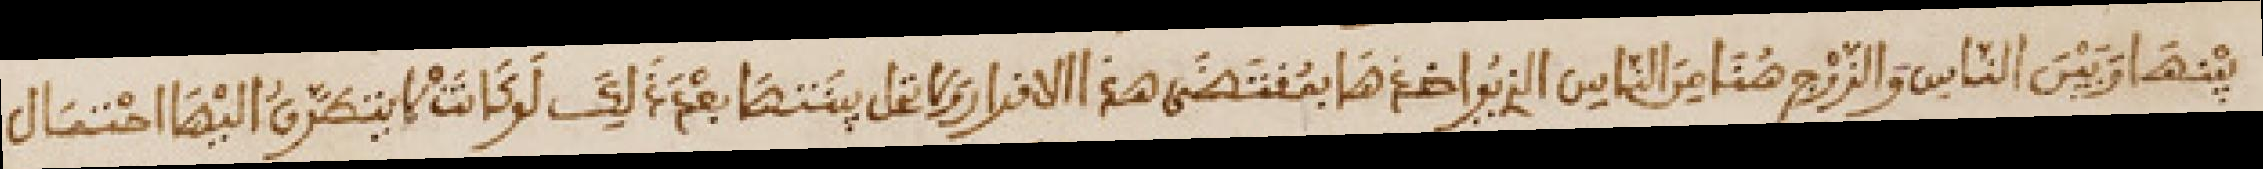بينها وبين الناس والزوج هنا من الناس الذي يواخذها بمقتضى هذا الاقرار ولا تحل ببينتها بعد ذلك لو كانت لا يتطرق اليها احتمال
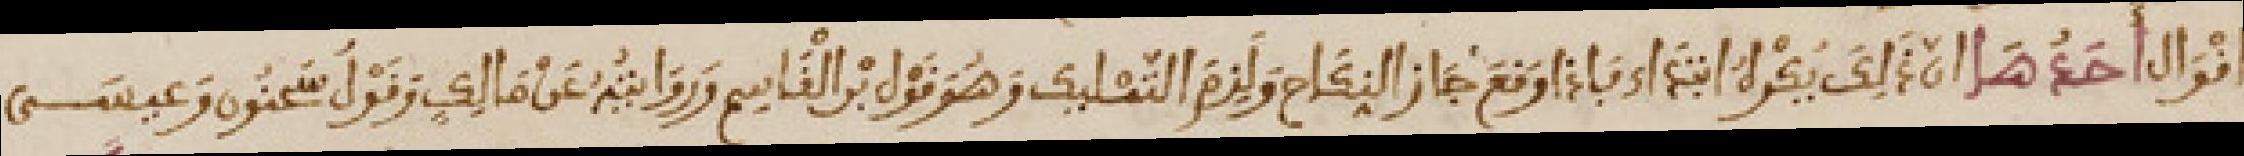اقوال احدها ان ذلك يكره ابتداء فاذا وقع جاز النكاح ولزم التمليك وهو قول بن القاسم وروايته عن مالك وقول سحنون وعيسى
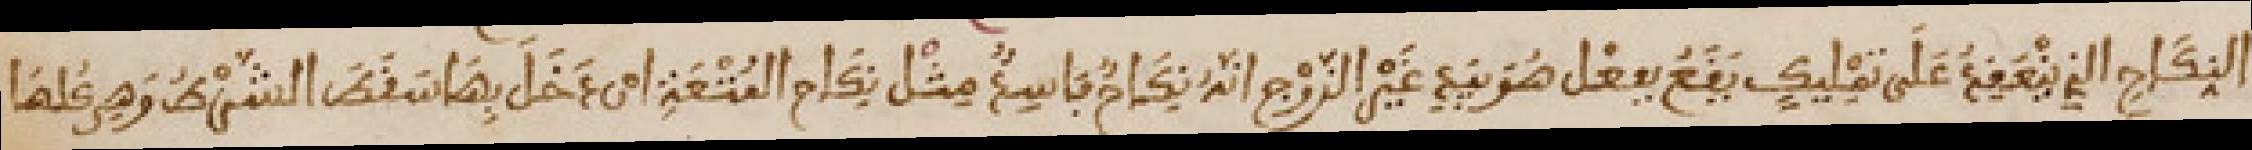النكاح الذي ينعقد على تمليك يقع بفعل هو بيد غير الزوج انه نكاح فاسد مثل نكاح المتعة ان دخل بها سقط الشرط وهي كلها
